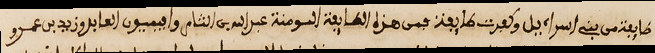طائفة من بنى اسراءيل وكفرت طائفة فمن هذه الطائفة المومنة عبد الله بن الثامر وافيميون العابد وزيد بن عمرو
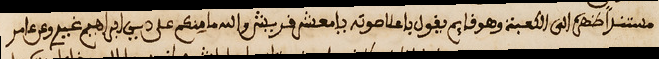مستنداً ظهره الى الكعبة وهو قائم يقول باعلا صوته يا معشر قريش والله ما منكم على دين ابراهيم غيرى وعلى عامر
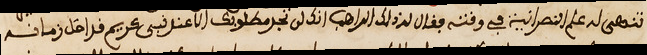تنهى له علم النصرانية في وقته فقال له ذلك الراهب انك لى تجد مطلوبك الا عند نبى كريم قد احل زمانه
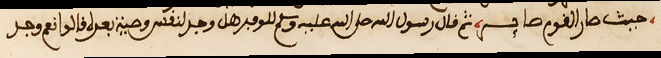حيث صار القوم صائر ثم قال رسول الله صلى الله عليه وسلم للوفر هل وجد لنقس وصية بعده قالوا نعم وجد
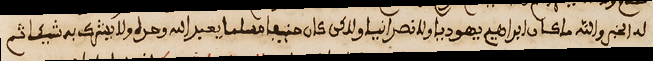له الخبر والله ما كان ابراهيم يهوديا ولا نصرانيا ولاكن كان حنيفا مسلما يعبد الله وحده ولا يشرك به شيئا ثم
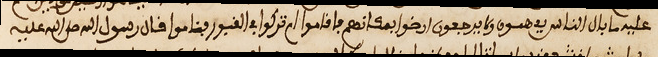عليه ما بال الناس يدهمون ولا يرجعون ارضوا بمكانهم فاقاموا ام تركوا في القبور فناموا قال رسول الله صلى الله عليه
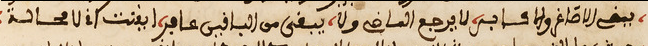ليضى الاصّاغر والاكابر لا يرجع الماضى ولا يبقى من الباقين عافر ايقنت انى لا محالة
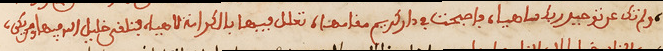ولم تك عن توحيد ربك ساهيا فاصبحت في دار كريم مقامها تعلل فيها بالكرامة لاهيا فتلقى خليل الله فيها ومن يكن
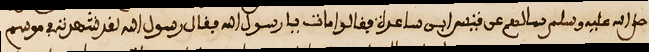صلى الله عليه وسلم سالهم عن قيس ابن ساعدة فقالوا مات يا رسول الله فقال رسول الله لقد شهدته في موسم
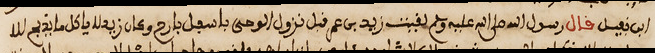ابن نفيل قال رسول الله صلى الله عليه وسلم لقيت زيد بن عمر قبل نزول الوحى باسفل بارح وكان زيد لا ياكل ما يذبح للا
